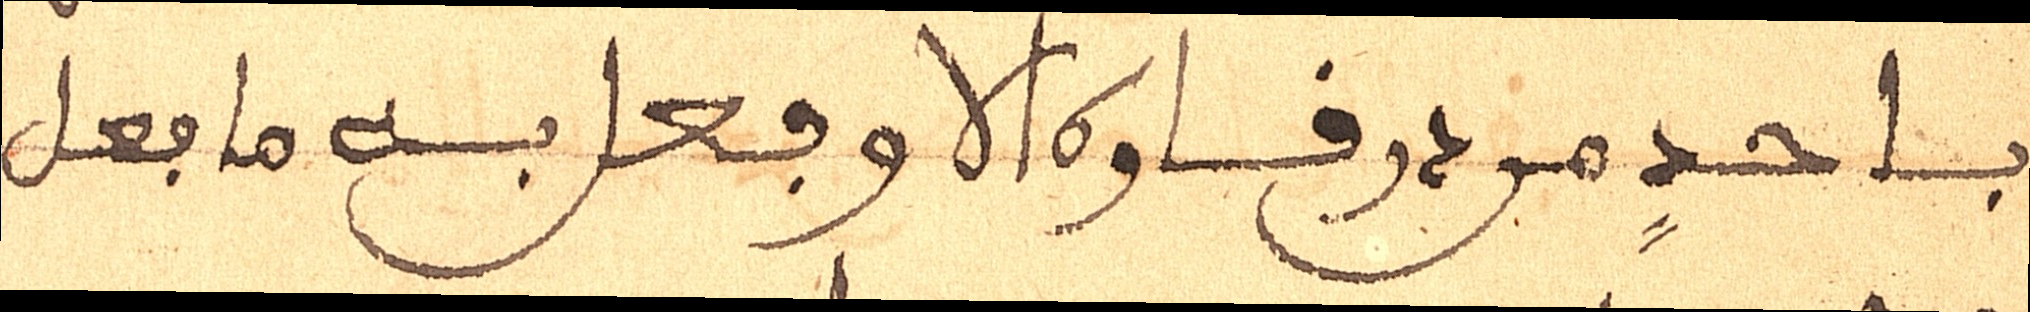باحد من درقاوه الاوفعل به مافعل
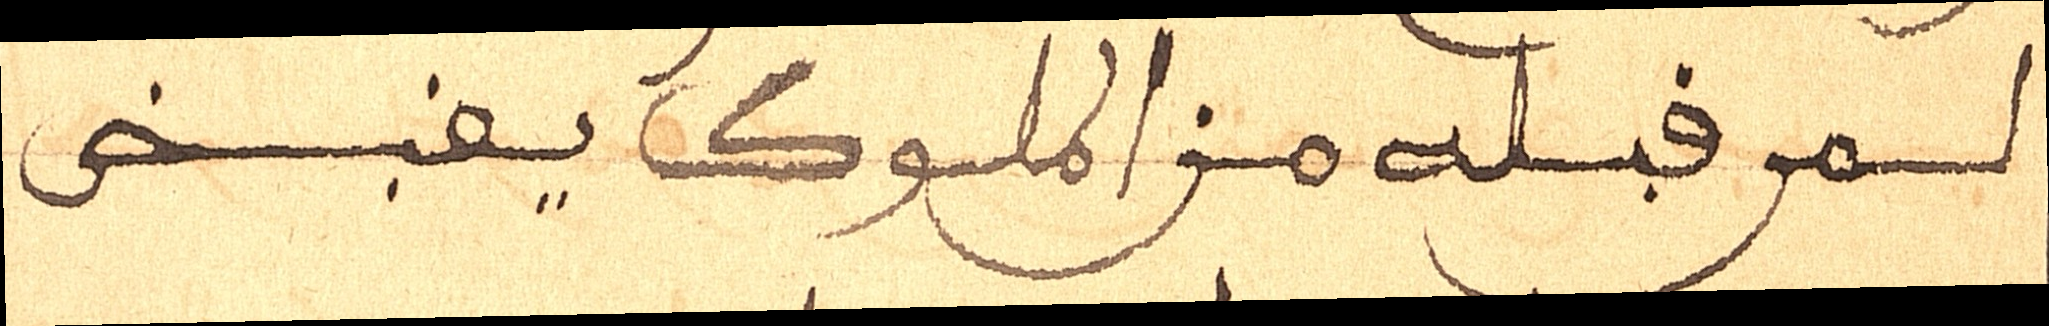لمن قبله من الملوك يقبض
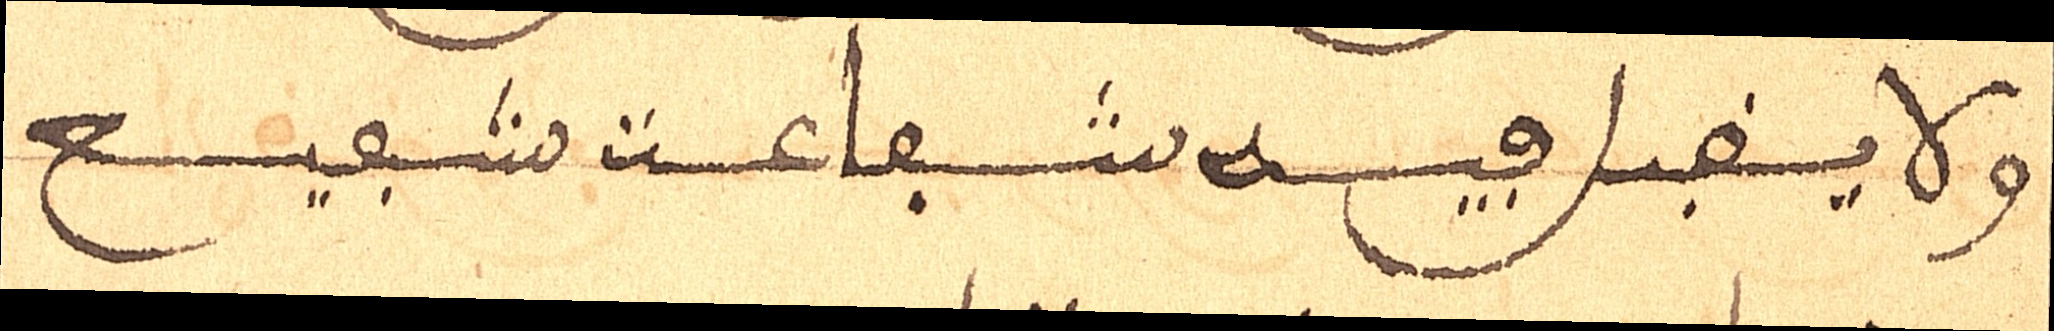ولا يقبل فيه شفاعة شفيع
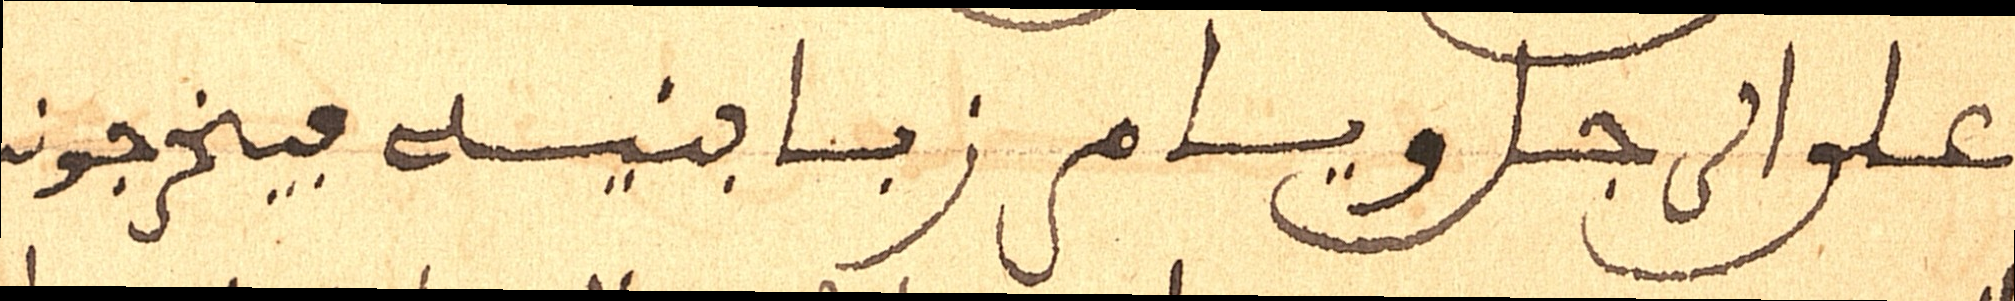على الرجل ويامر زبا بنيه فيخرجونه
